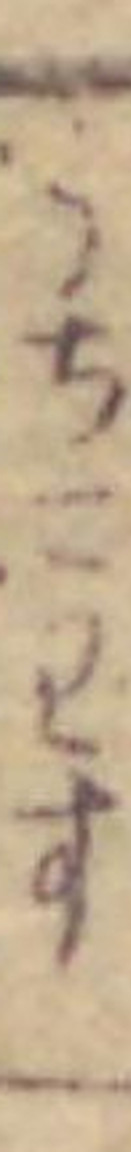うちこわす
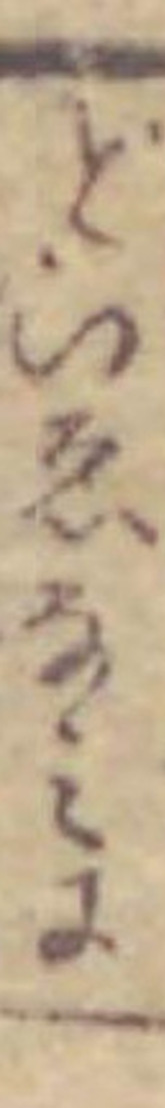といゑなみに
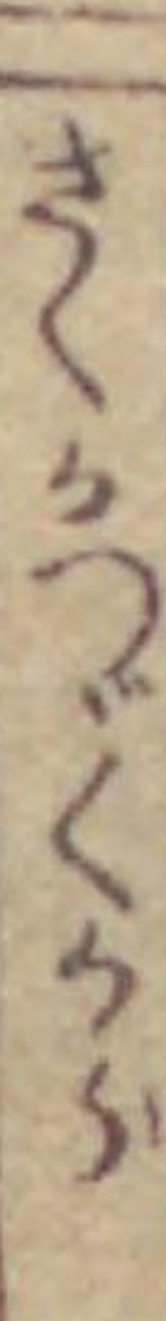さくかつゞくから
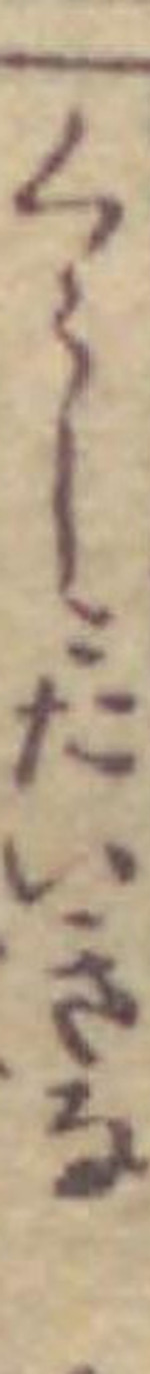くらしにたいきな
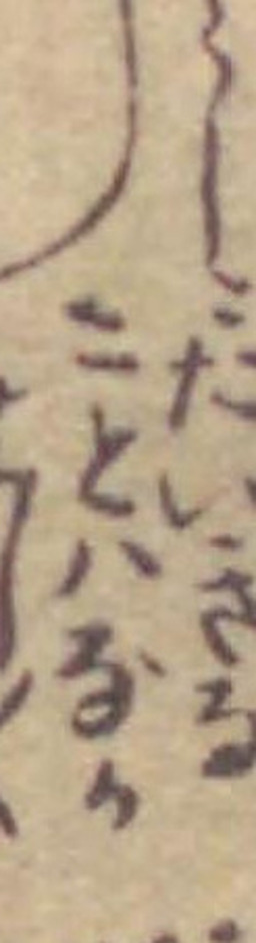ことはなか
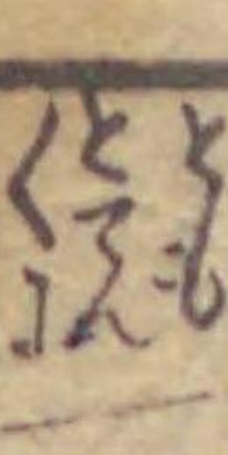とてん
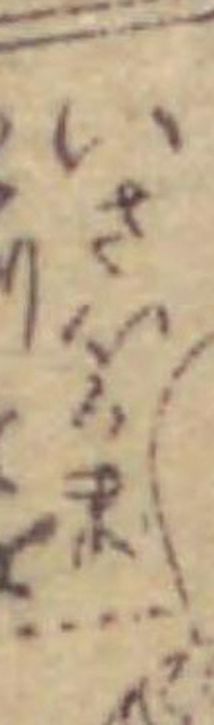いさいかま
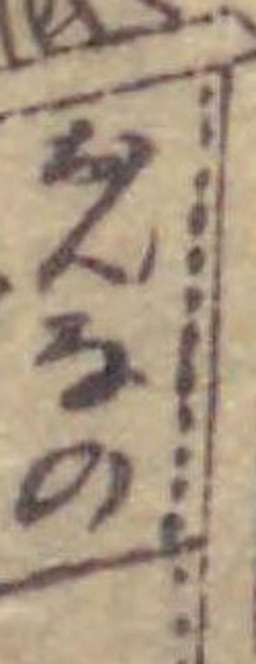おんなの
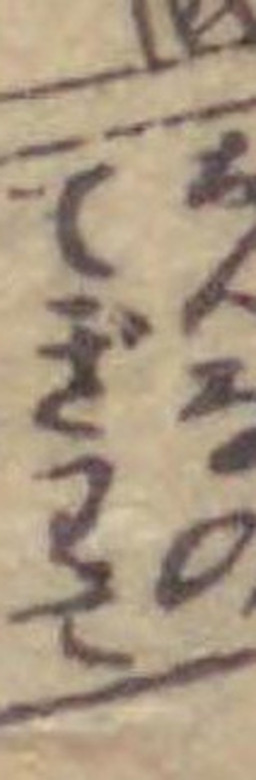てぎわて
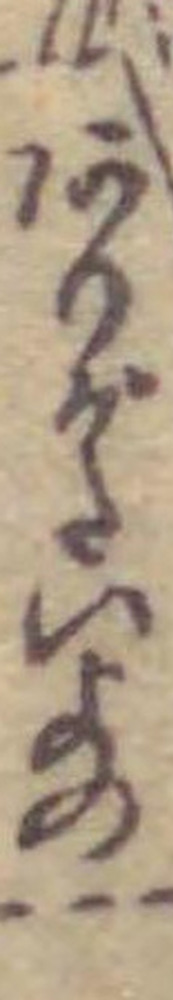ありがたいよの
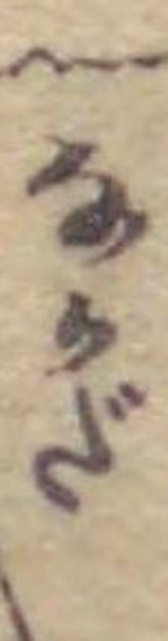なかだ

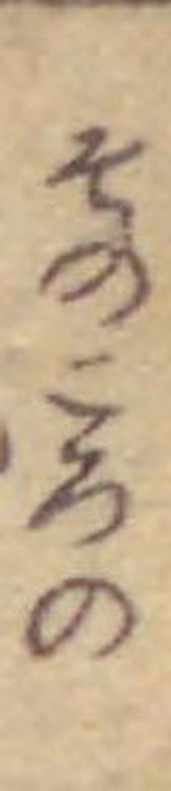そのころの
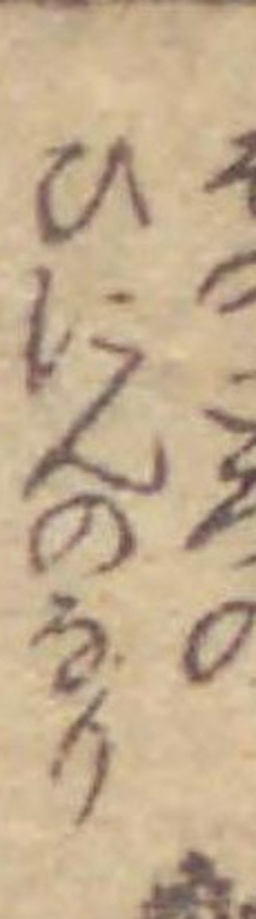ひにんのなり
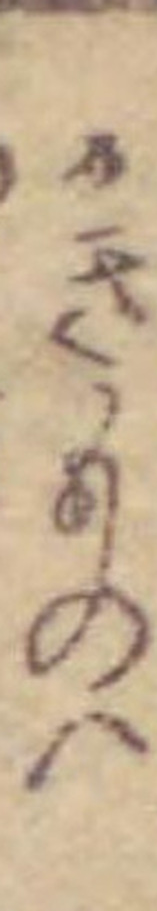はきものは
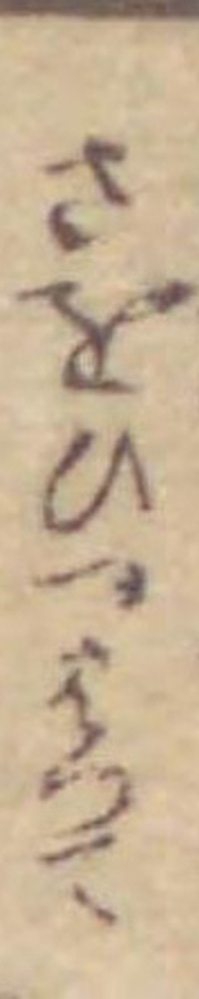さをひつはつて
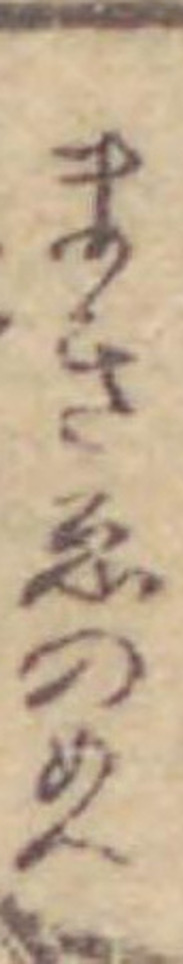まきゑのめん
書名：天下一面鏡梅鉢 : 3巻
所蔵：国立国会図書館 National Diet Library, JAPAN
